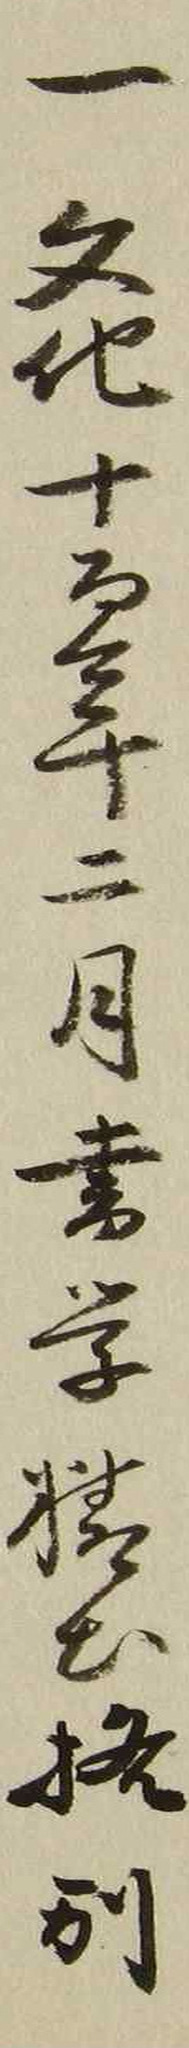一文化十酉年二月書学精出格別
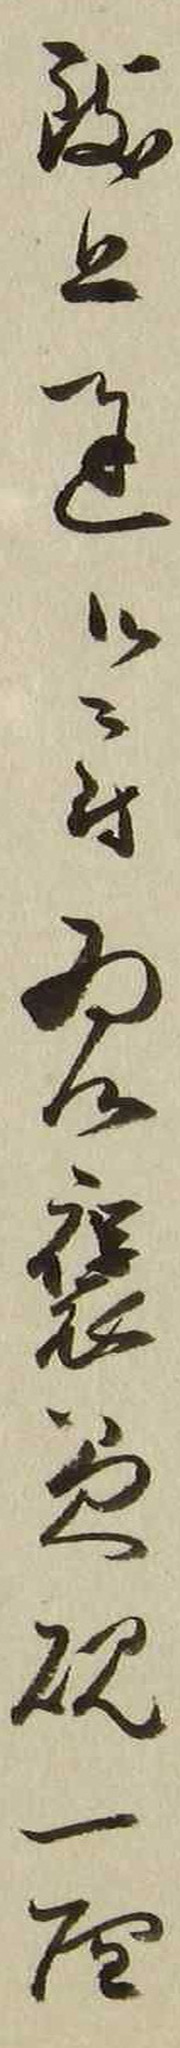致上達候ニ付為御褒美硯一面
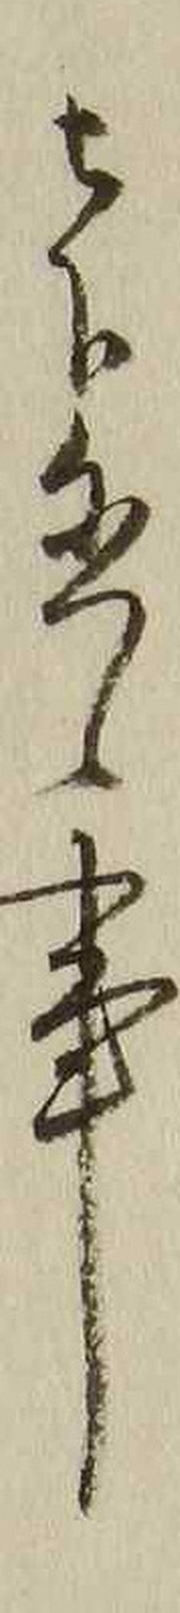被下置候事
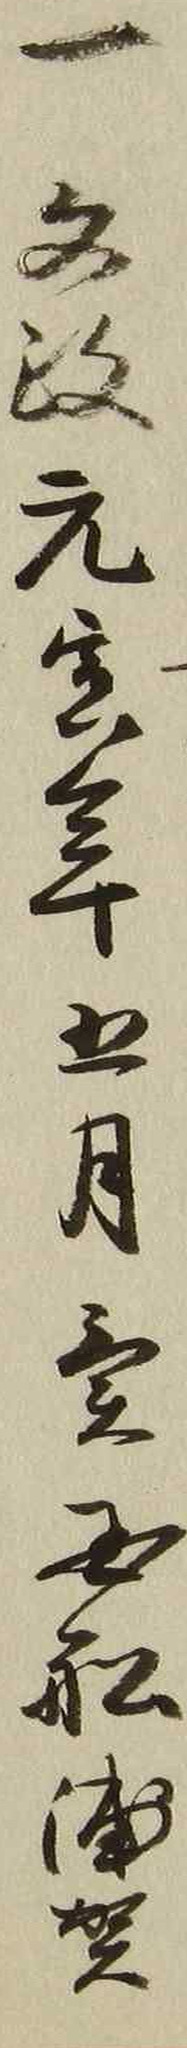一文政元寅年五月異国船浦賀
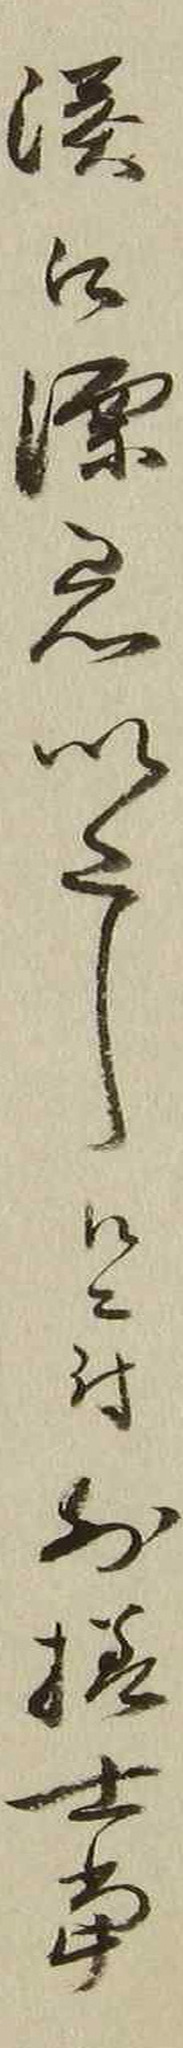湊江漂着いたし候ニ付外様士当
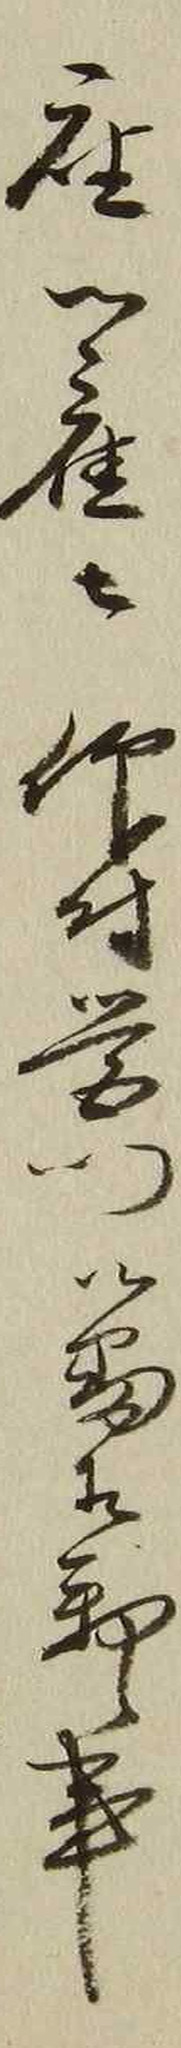座御雇被仰付営門御番相勤候事
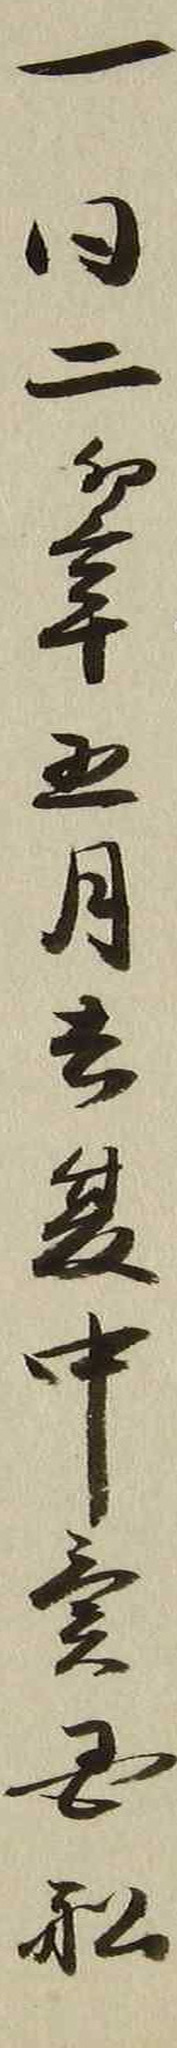一同二卯年五月去夏中異国船
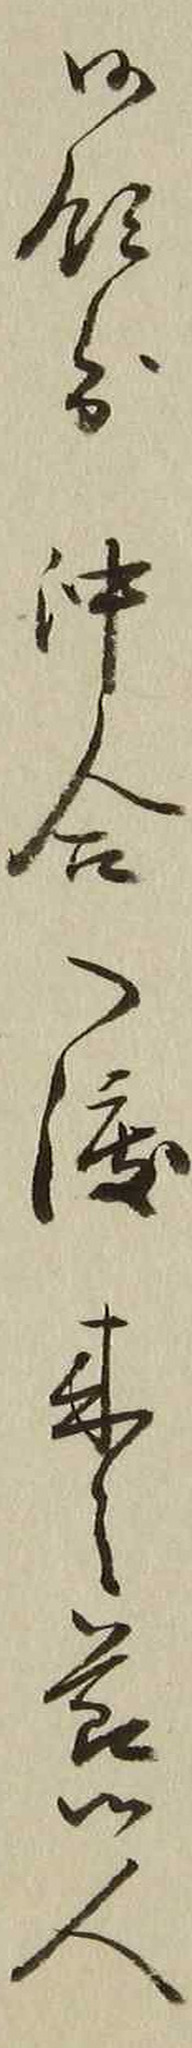御領分沖合へ渡来之節御人
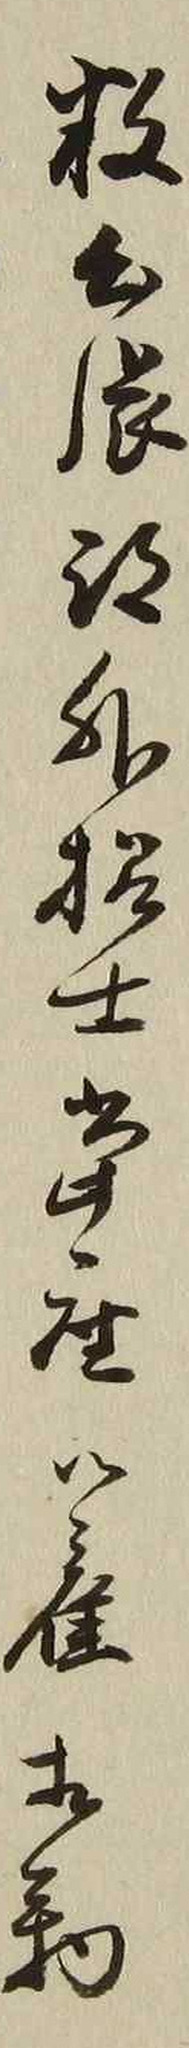数出張跡外様士当座御雇相勤
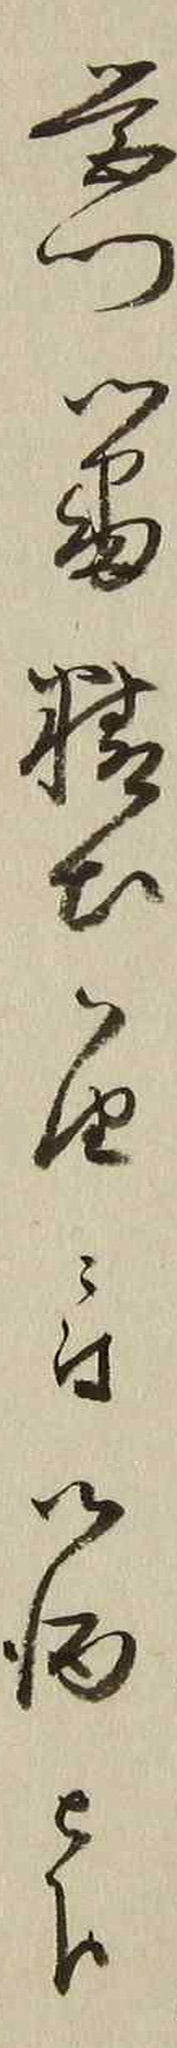営門御番精出候由ニ付御酒被下
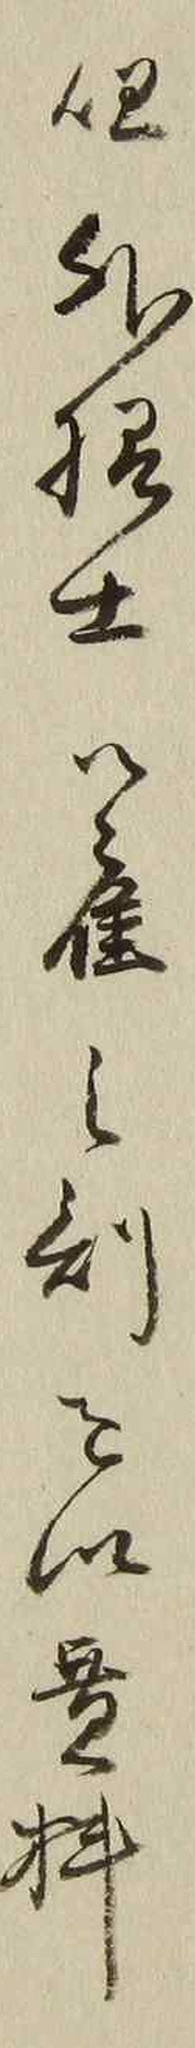但外様士御雇之割を以費料
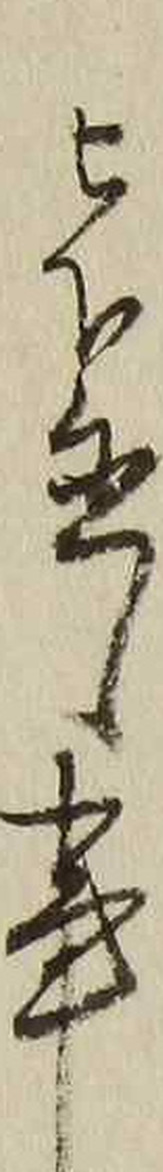被下置候事
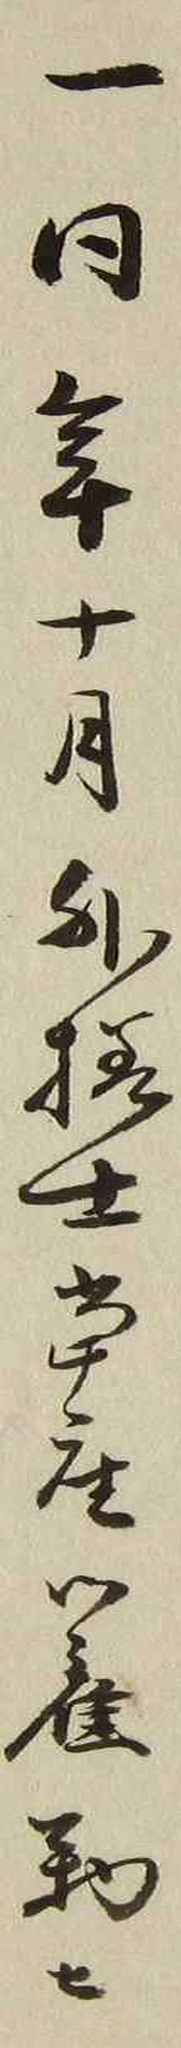一同年十月外様士当座御雇勤被
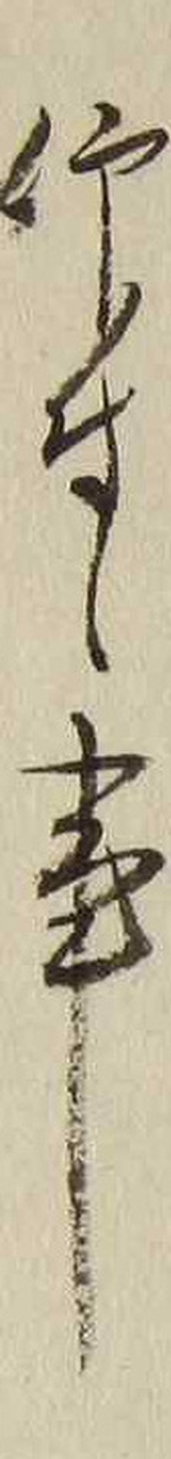仰付候事
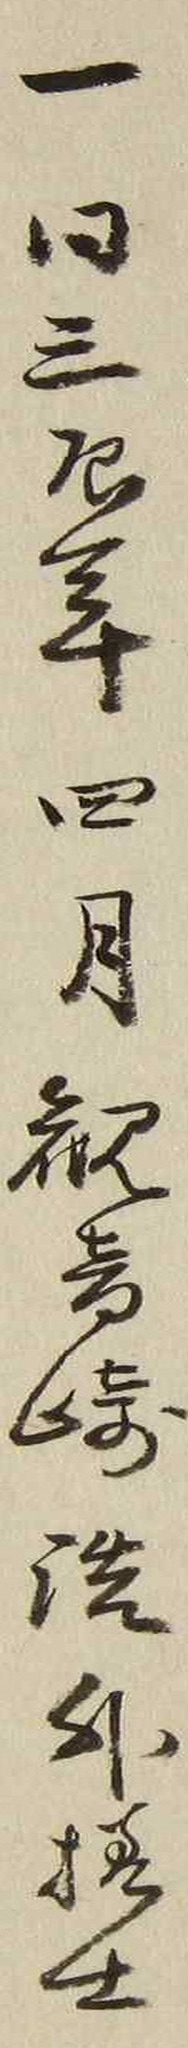一同三辰年四月観音崎詰外様士
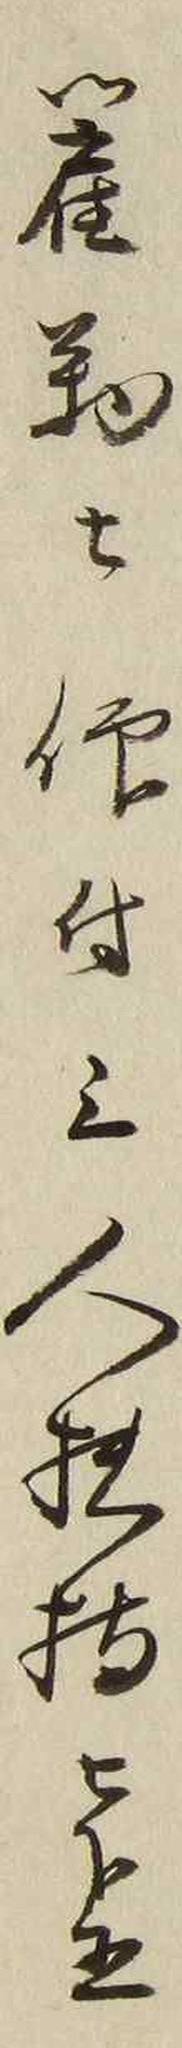御雇勤被仰付三人扶持被下置
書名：諸士系譜　巻之288　さ之部20
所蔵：会津若松市立会津図書館
